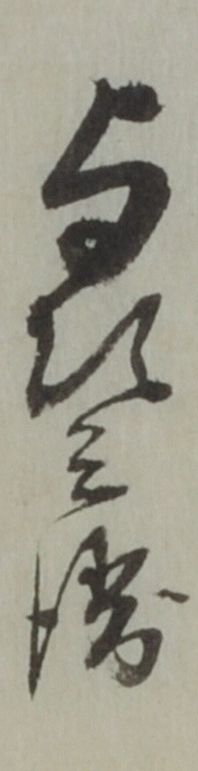与次兵衛
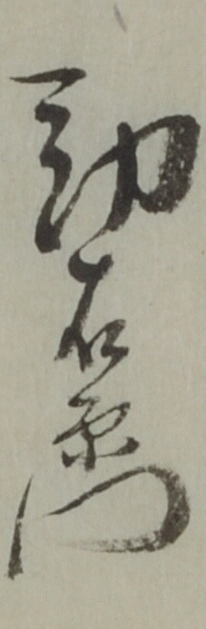勘右衛門
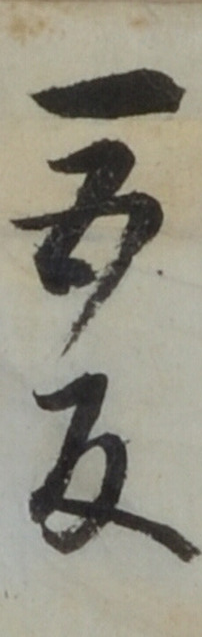一五反
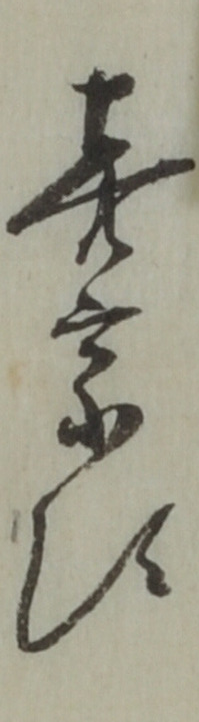喜宗次
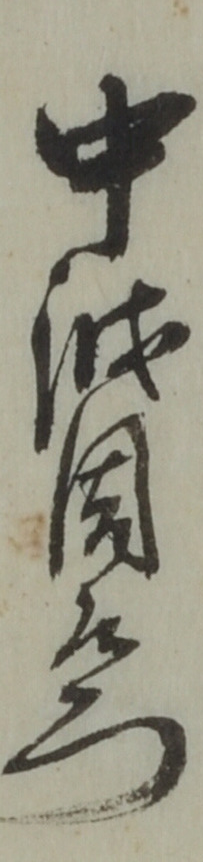中越周左衛門
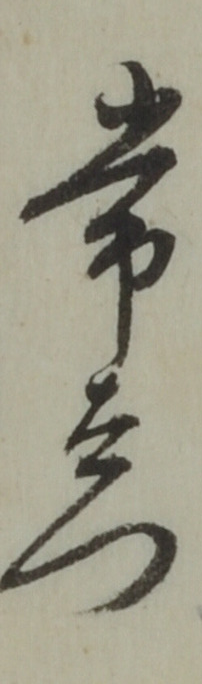常右衛門
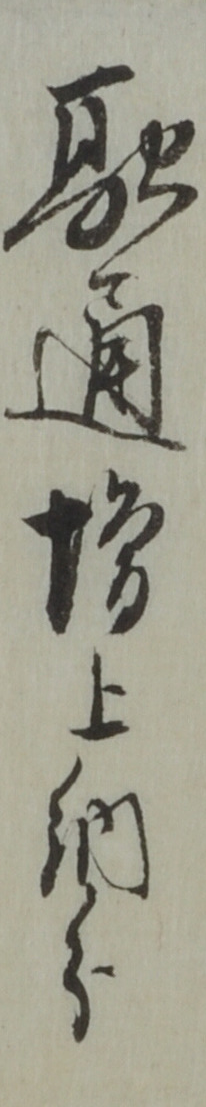融通増上納分
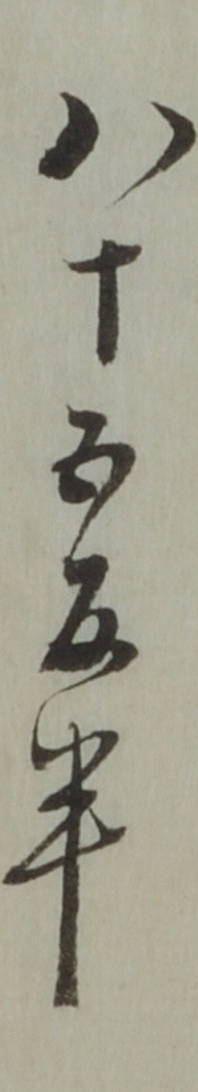八十五反半
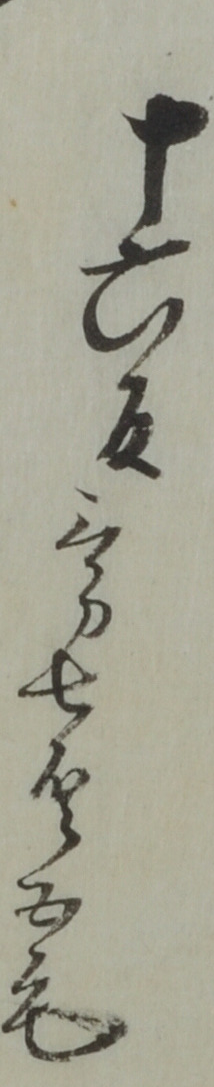十六反三分七厘五毛
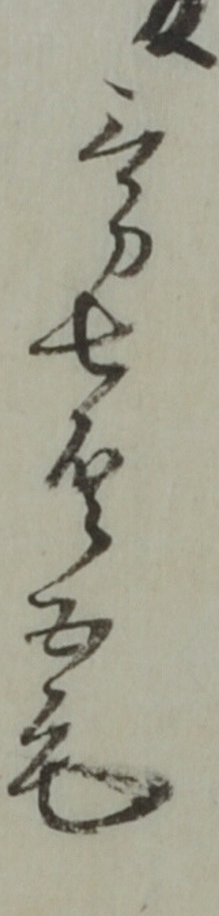三分七厘五毛
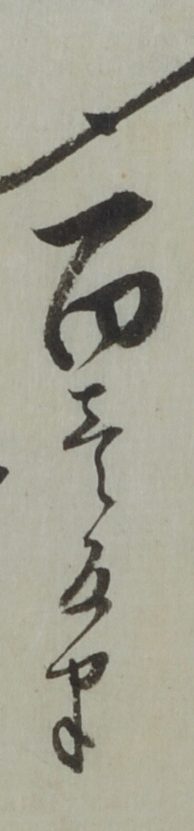〆百壱反半
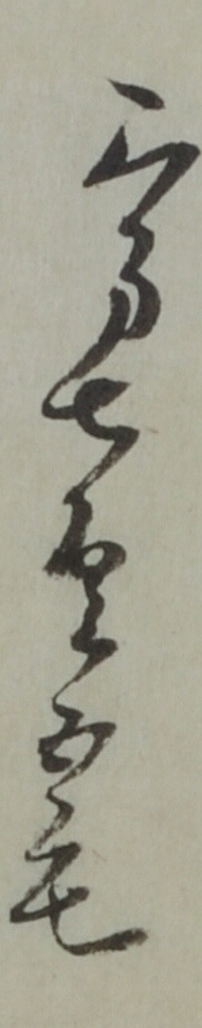三分七厘五毛

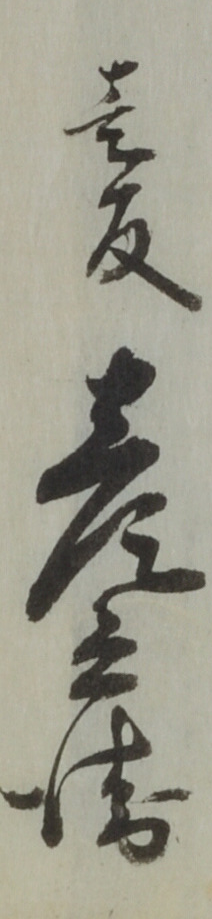壱反彦兵衛
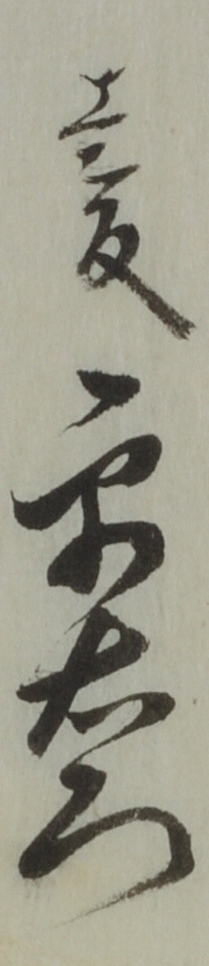壱反平右衛門
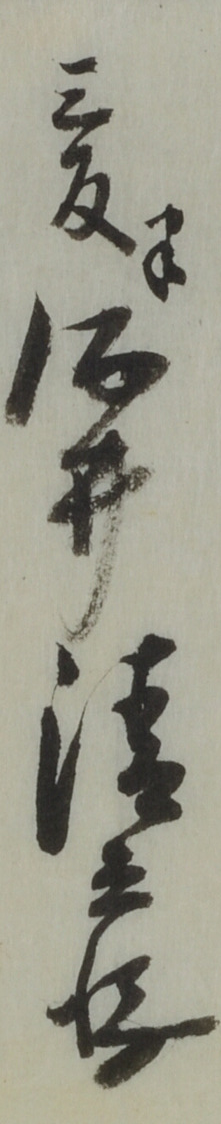三反半酒井清兵衛
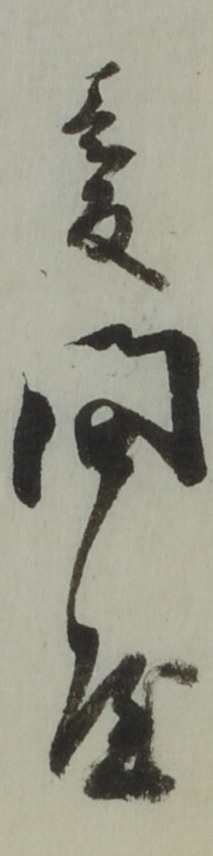壱反問屋
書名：融通割合帳
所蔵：伊那市立高遠町図書館・合同会社AMANE
